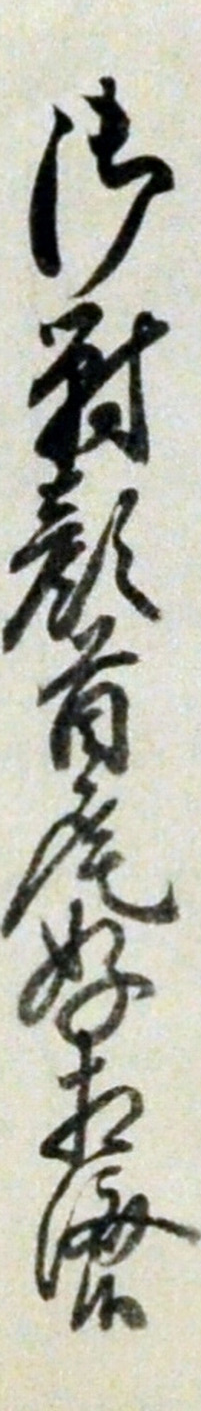御対顔首尾好相済候
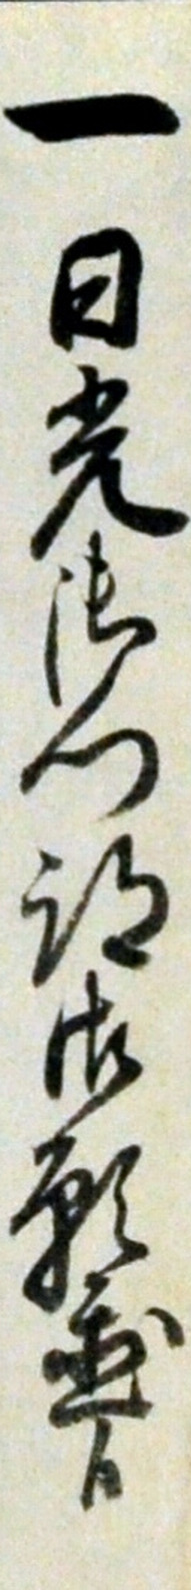一日光御門跡御願置候
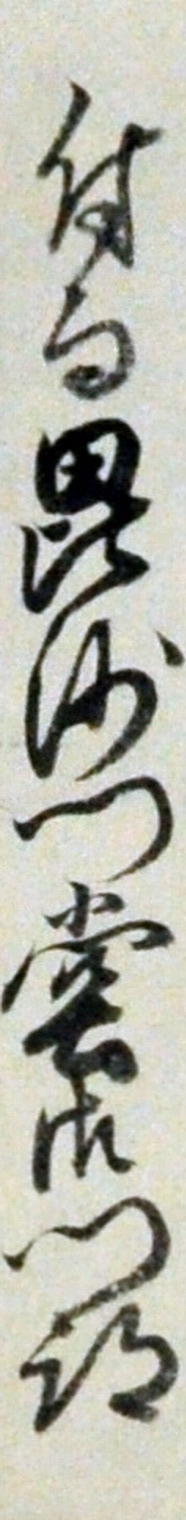付て毘沙門堂御門跡
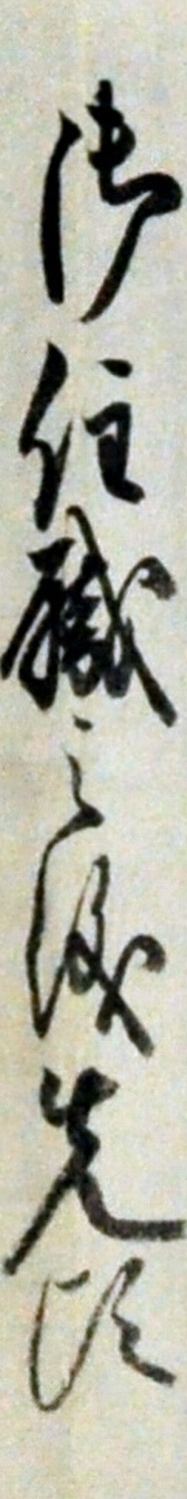御住職之儀先頃
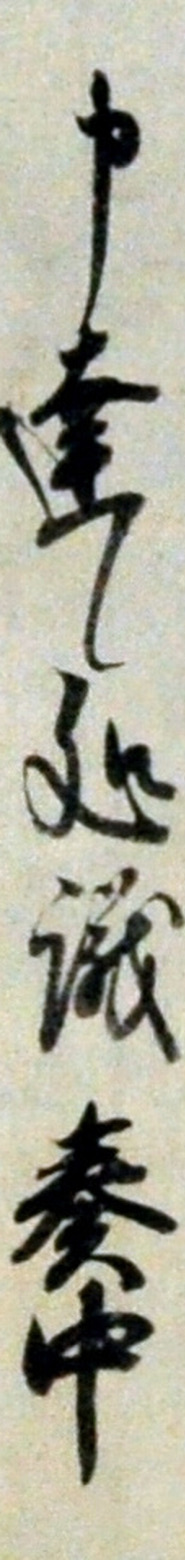申達候処議奏中
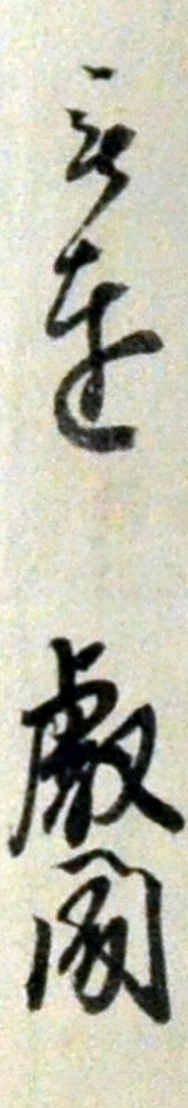被達叡聞
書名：書状
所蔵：伊那市立高遠町図書館・合同会社AMANE
